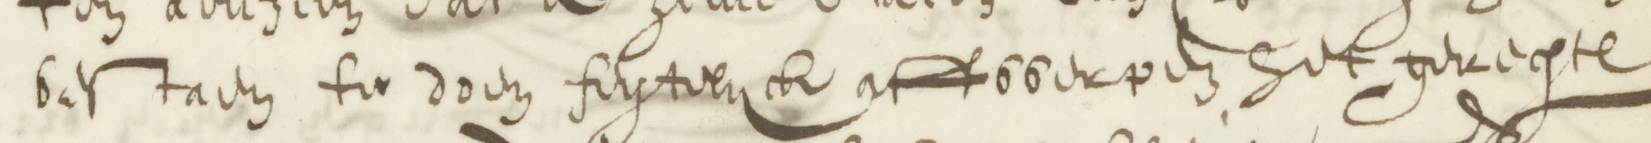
bestaen te doen feytelyck affwerpen het gerechte
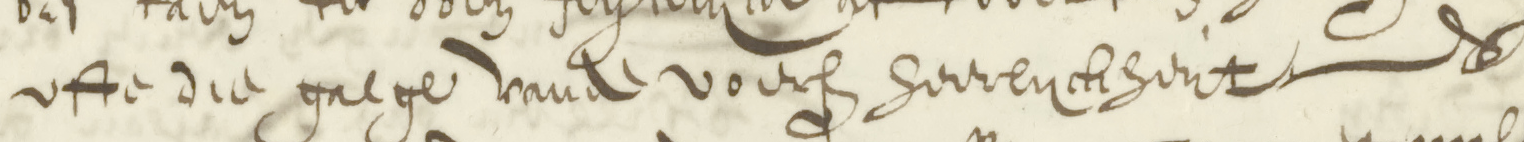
ofte die galge vande voers heerlycheyt
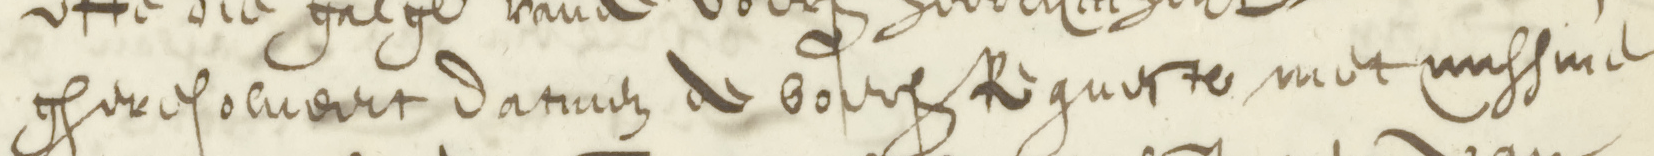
gheresolveert datmen de voers Requeste met missiue
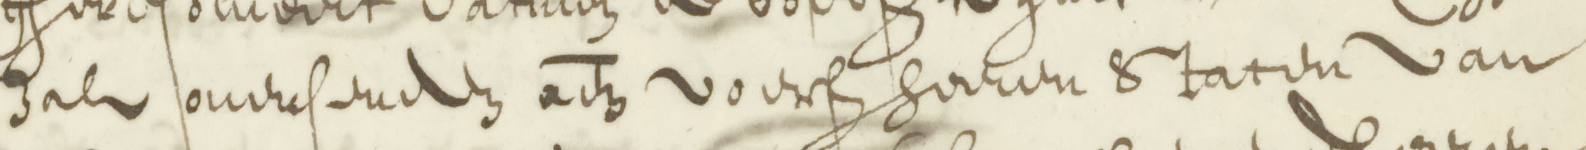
zal ouersenden aen voers heeren Staten van
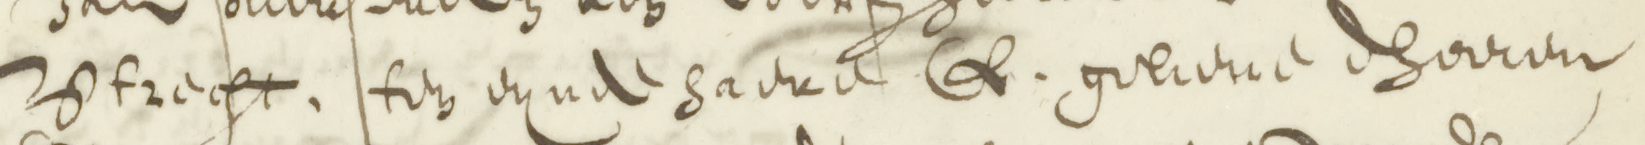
Utrecht, ten eynde haere E. gelieve dheeren
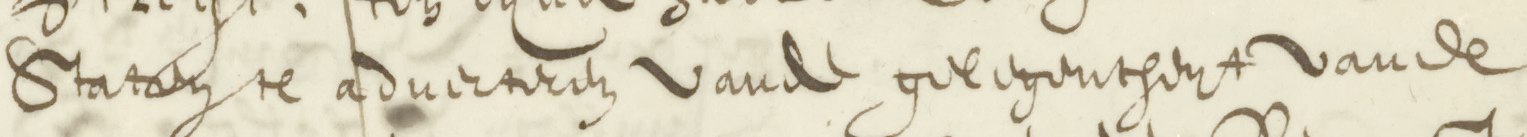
Staten te adverteren vande gelegentheyt vande
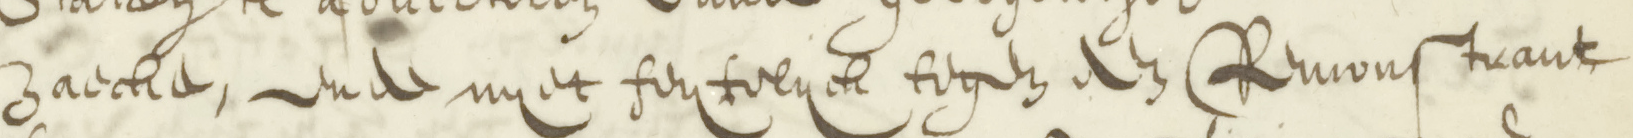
zaecke, ende nyet feytelyck tegen den Remonstant
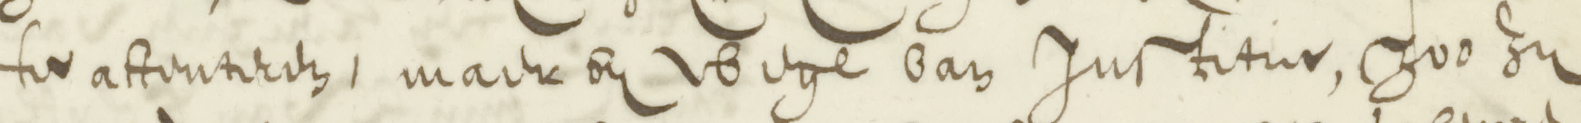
te attenteren, maer by wege van Justitie, zoo zy
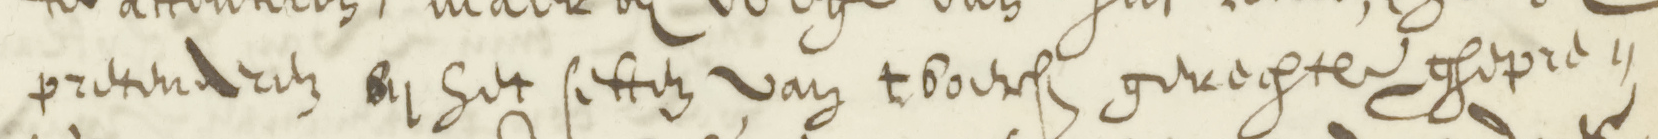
pretenderen by het setten van tvoers gerechte ghepre„
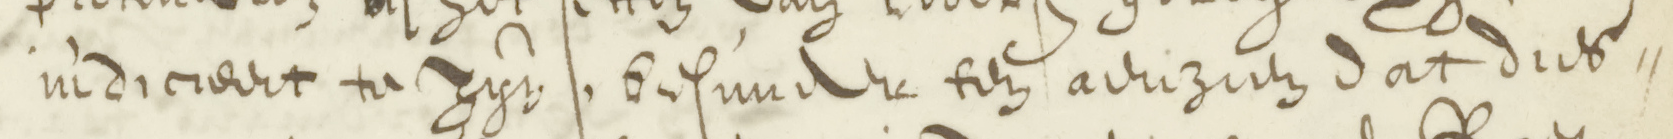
iudicieert te zijn, besunder ten aenzien dat dies„
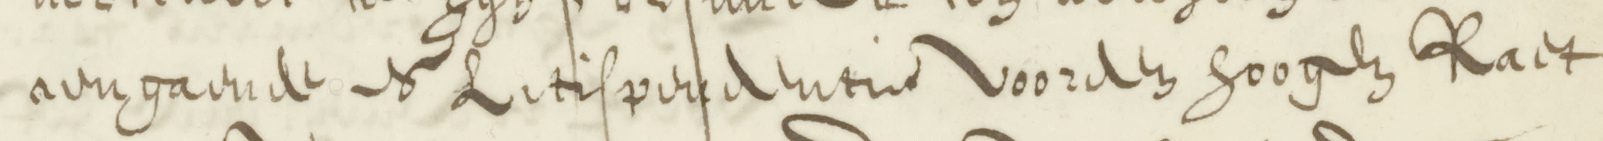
aengaende es Litispendentie voorden hoogen Raet
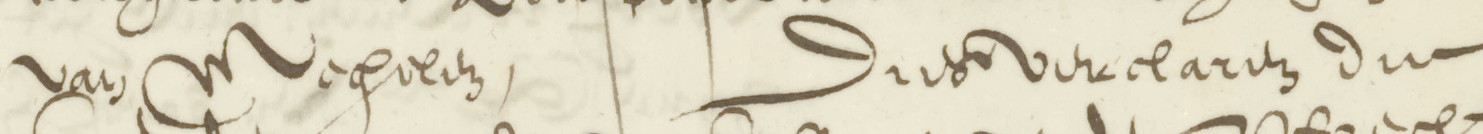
van Mechelen. Dies verclaren die
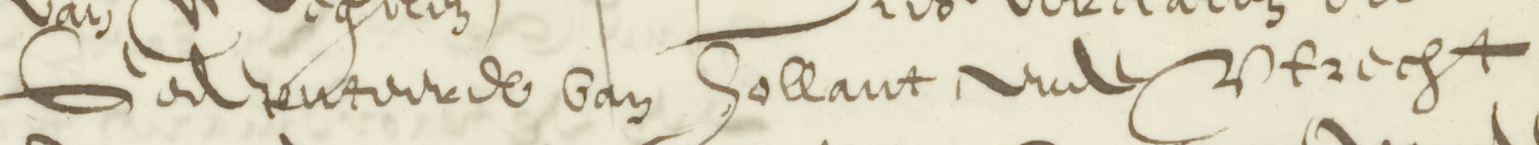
Gedeputeerde van Hollant ende Utrecht
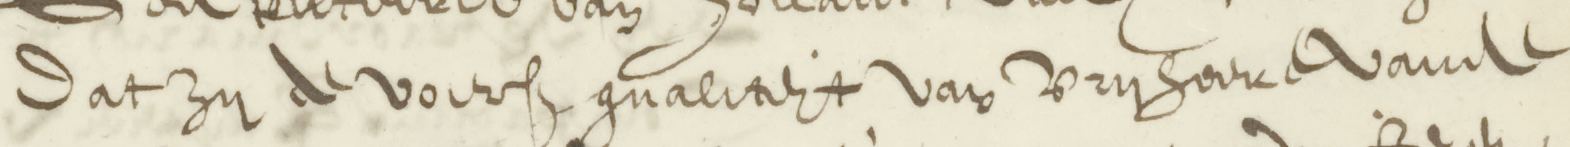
dat zij de voers qualiteit van vryheere vande
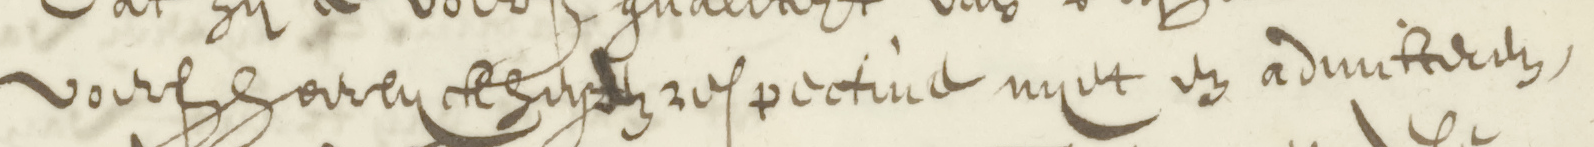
voers heerlyckheyden respectiue nyet en admitteren,
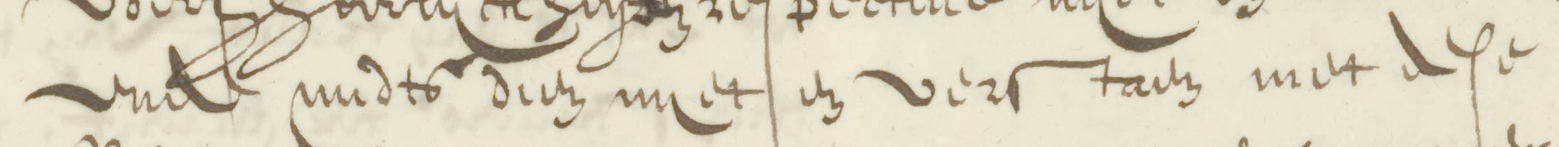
ende midts dien nyet en verstaen met dese
